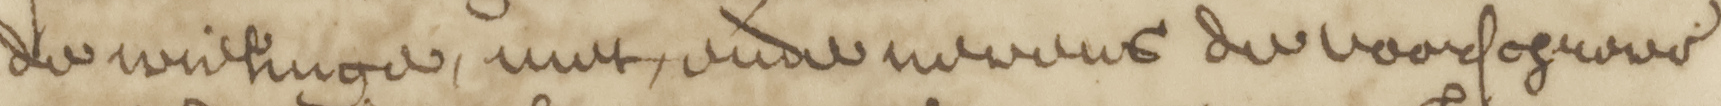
de wielinge, met, ende nevens de voorschreve
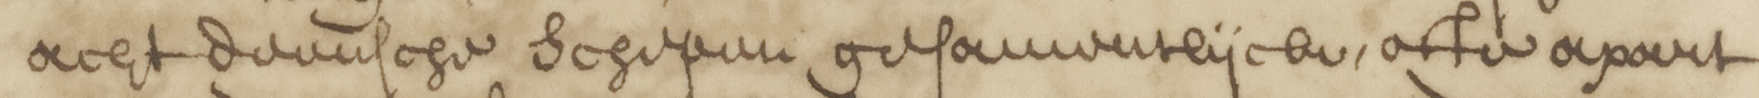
acht deensche schepen gesamentlijck, ofte apart
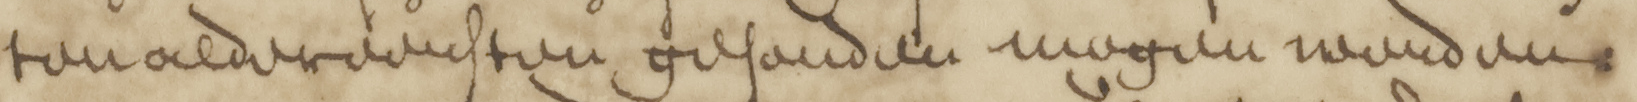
ten aldereersten gesonden mogen werden
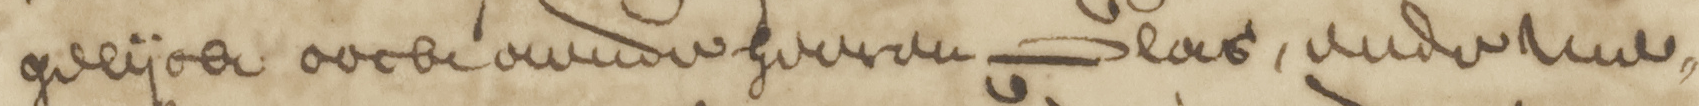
gelijck oock aende heeren Glas, ende Me,,
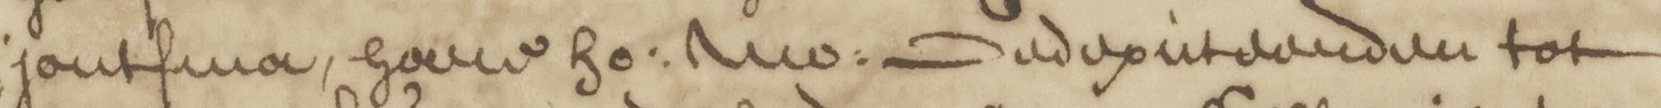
,,jontsma, hare ho:Mo: Gedeputeerden tot
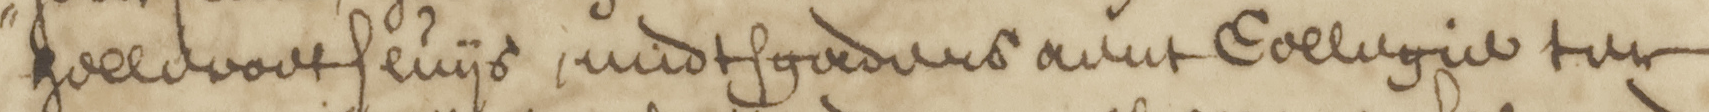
hellevoetsluijs, midtsgaders aent Collegie ter
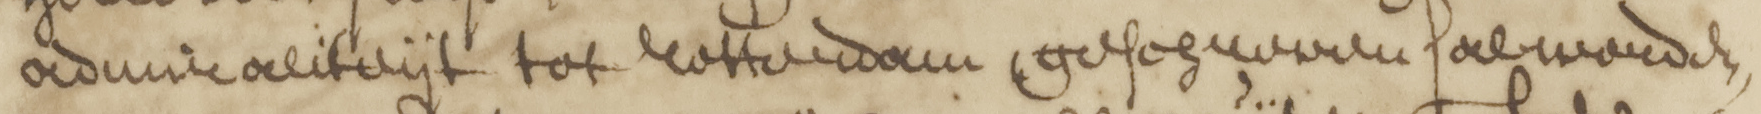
admiraliteijt tot rotterdam, geschreven sal werden,
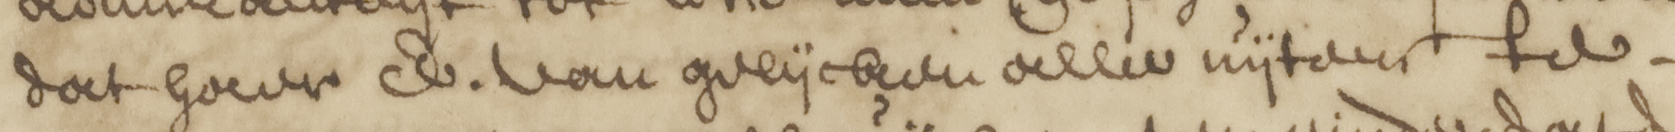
dat haer E. van gelijcken alle uijterste
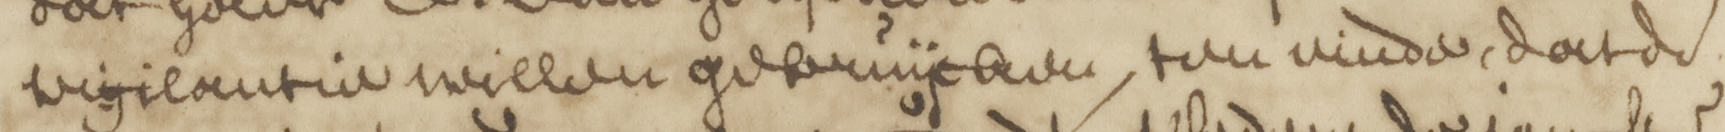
vigilantie willen gebruijcken, ten einde, dat de
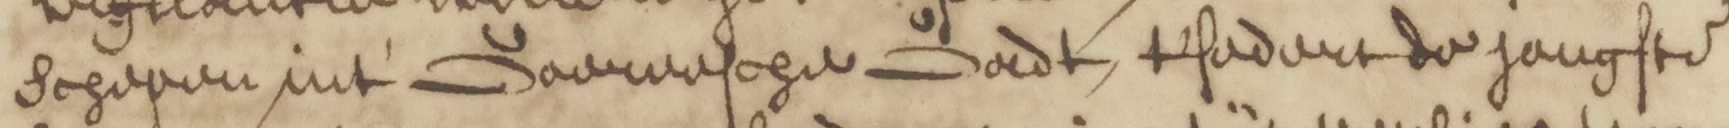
schepen int' Goereesche Gadt, t'sedert de jongste
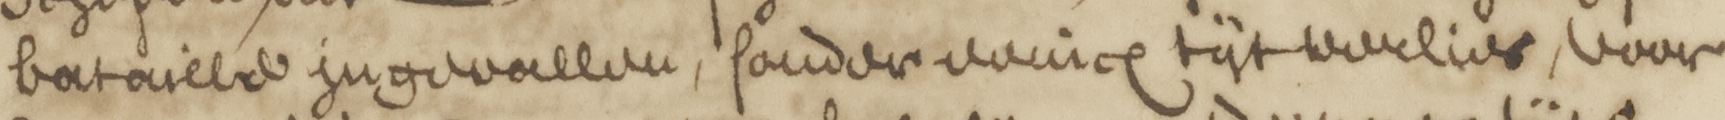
bataille Ingevallen, sonder eenich tijt verlies, voor
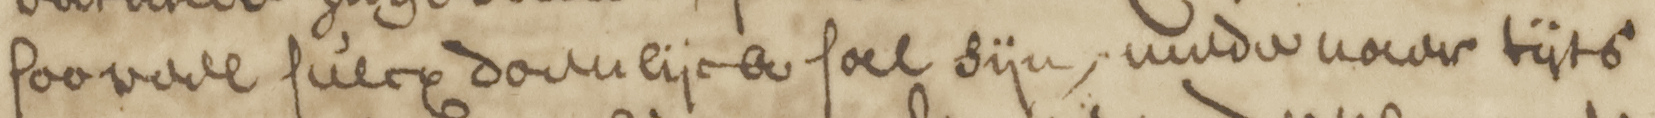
soo veel sulcx doenlijck sal sijn, mede naer tijts
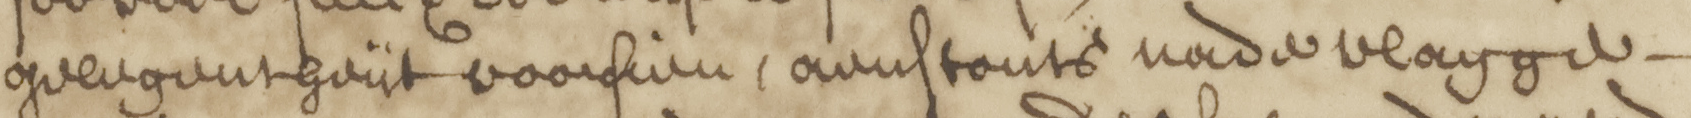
gelegentheijt voorsien, aenstonts nade vlagge
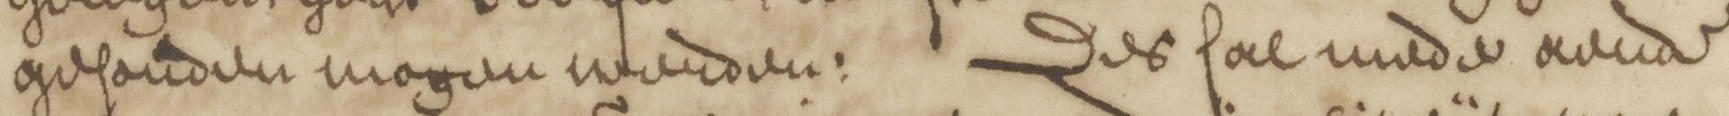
gesonden mogen werden: Des sal mede aende
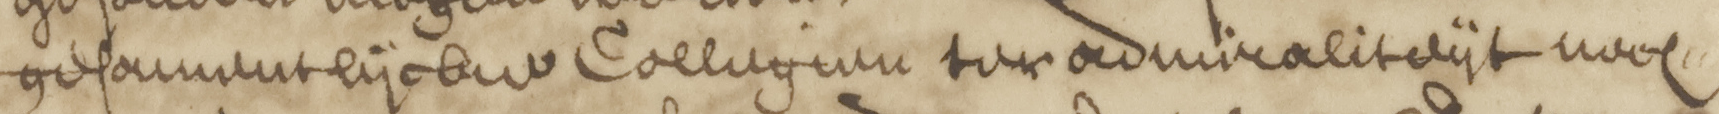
gesamentlijcke Collegien ter admiraliteijt noch,,
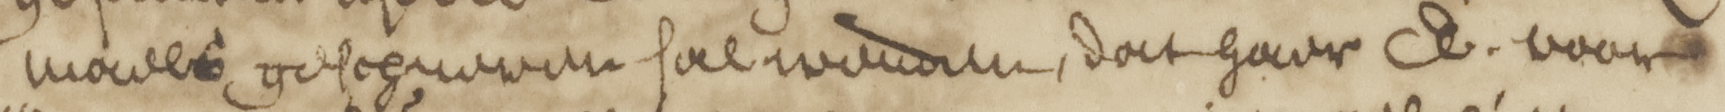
,,maels geschreven sal werden, dat haer E. voor
